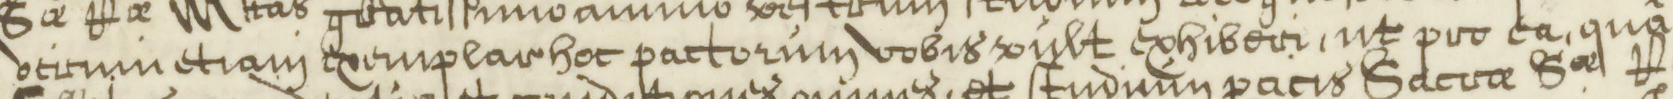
verum etiam Exemplar hoc pactorum vobis vult exhiberi, ut pro ea, qua
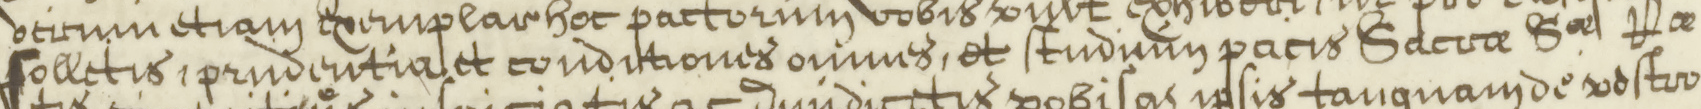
solletis, prudentia et conditiones omnes, et studium pacis Sacra Sæ Ræ
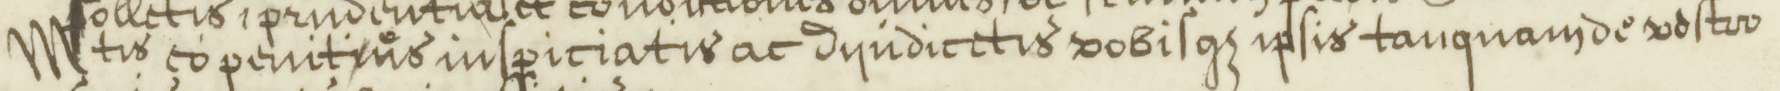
Mtis eo penitius inspiciatis ac dijudicetis vobisque ipsis tanquam de vestro
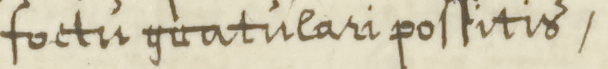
foetu gratulari possitis.
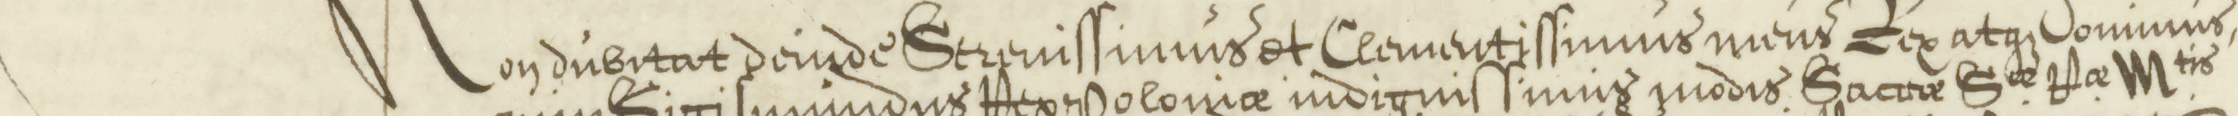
Non dubitat deinde Serenissimus et Clementissimus meus Rex atque Dominus,
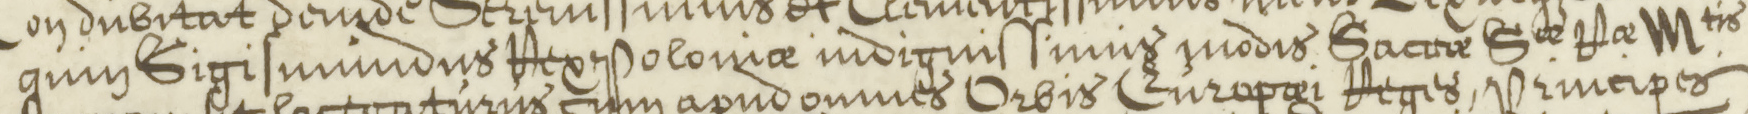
quin Sigismundus Rex Poloniæ indignissimis modis Sacræ Sæ Ræ Mtis
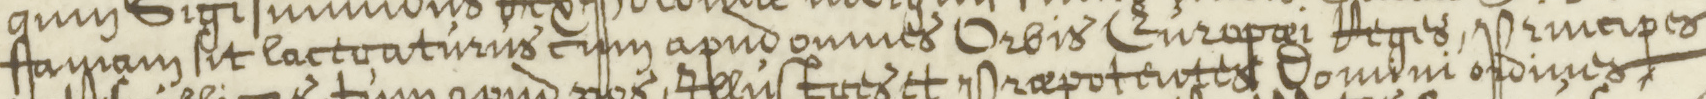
famam sit laceraturus cum apud omnes Orbis Europæi Reges, Principes
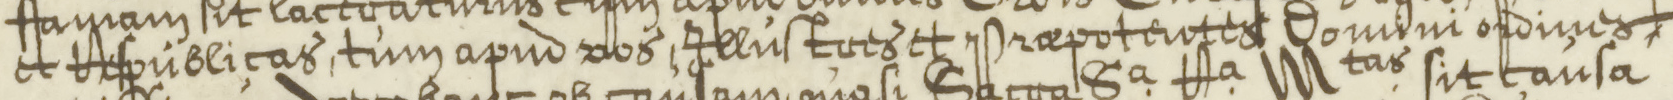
et Respublicas, tum apud vos, Illustres et Præpotentes Domini ordines,
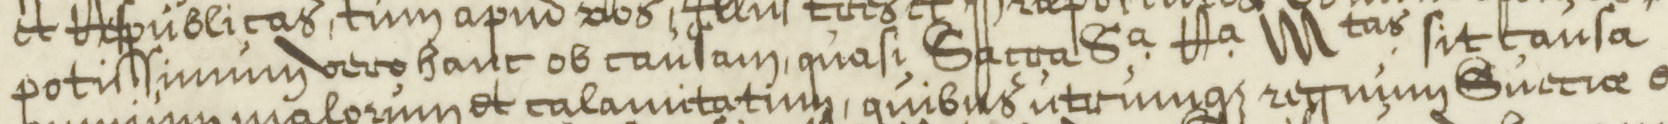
potissimum vero hanc ob causam, quasi Sacra Sa Ra Mtas sit causa
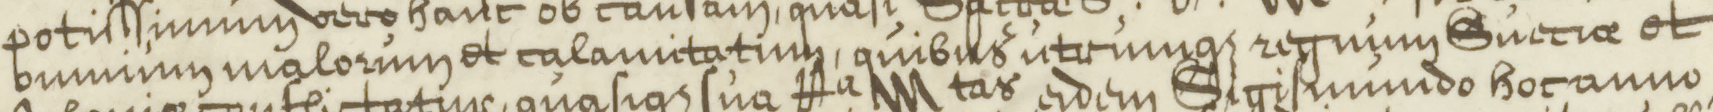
omnium malorum et calamitatum, quibus utrumque regnum Sueciæ et
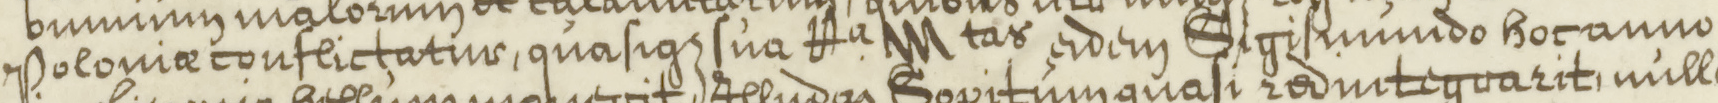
Poloniæ conflictatur, quasique sua Ra Mtas eidem Sigismundo hoc anno
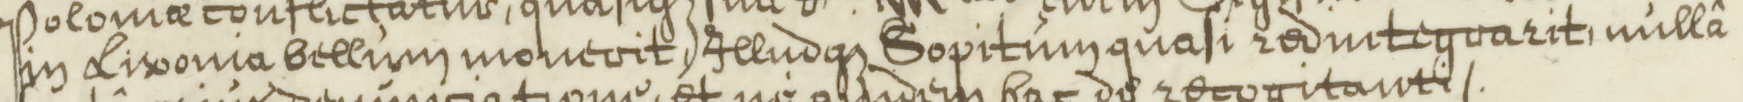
in Livonia bellum mouerit Illudque Sopitum quasi redintegrarit, nulla
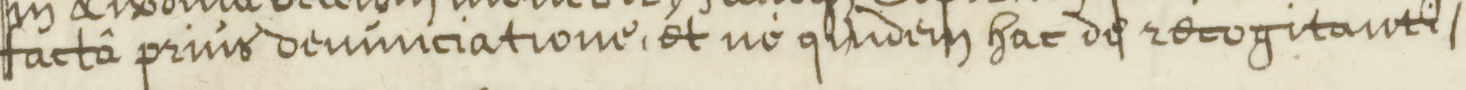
facta prius denunciatione, et ne quidem hac de re cogitanti.
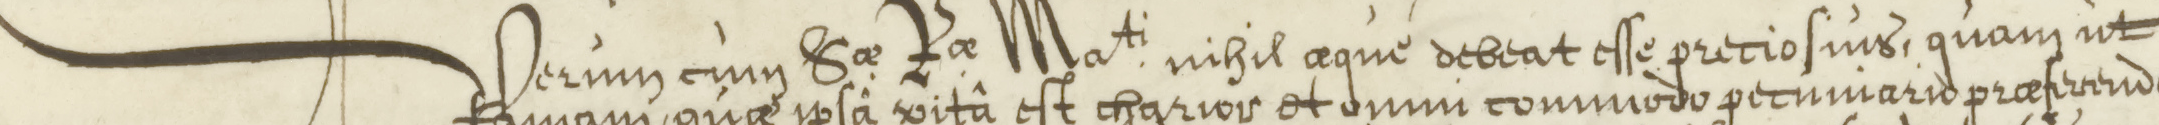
Verum cum Sæ. Ræ. Mati. nihil æque debeat esse preciosius quam ut
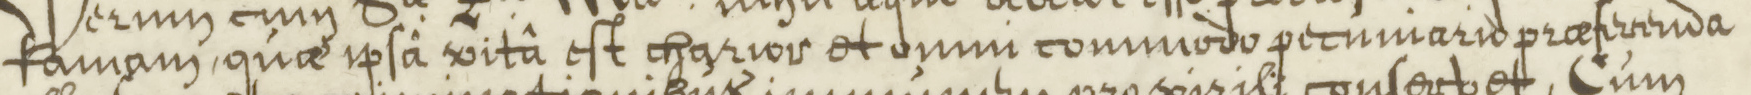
famam, quæ ipsa vita est charior et omni commodo pecuniaris præferenda,
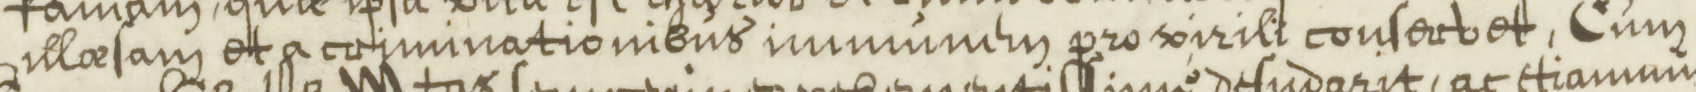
illæsam et a criminationibus immunem pro virili conservet. Cum
